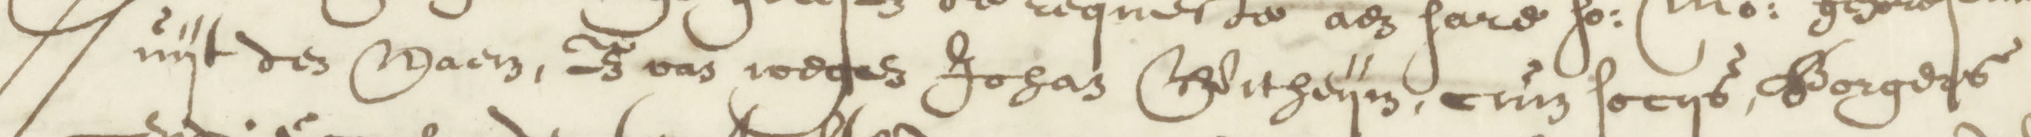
uijt den Naem, en van wegen Johan Witheijm, cum socys Borgers
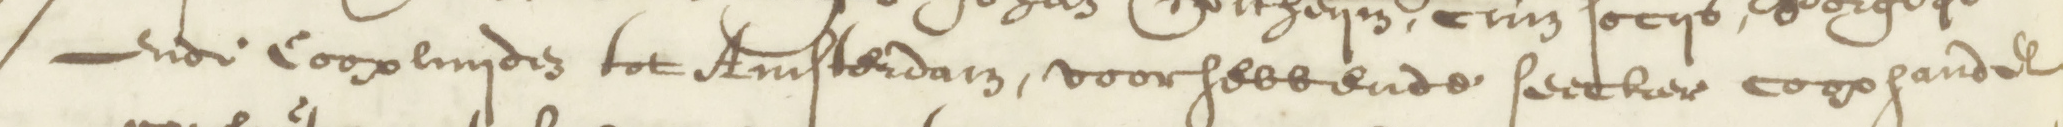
ende Coopluyden tot Amsterdam, voor hebbende seecker coophandel
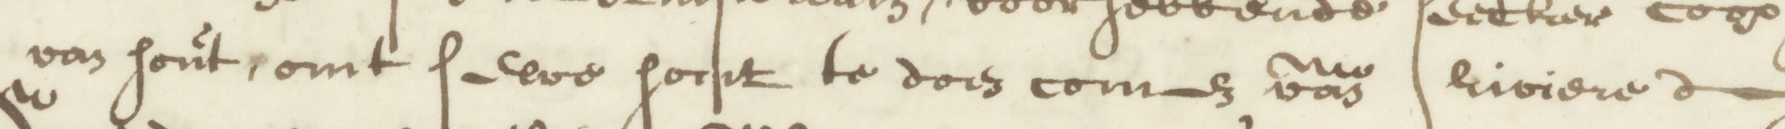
van hout, omt selve hout te doen comen van riviere de
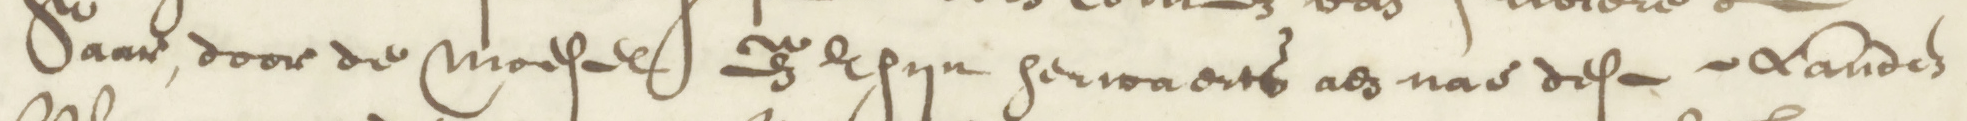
Saar, door de Moesel en Rhijn herwaerts aen nae dese Landen
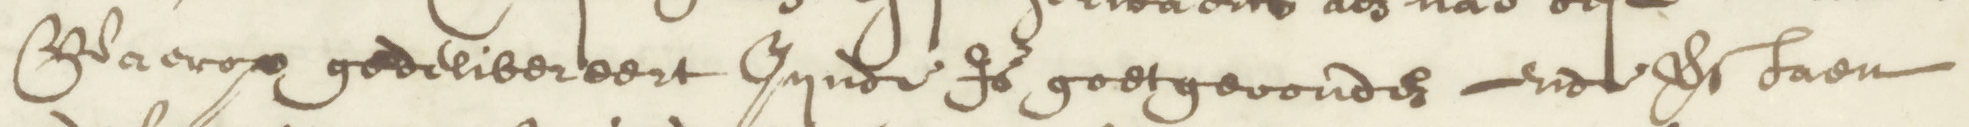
Waerop gedelibereert Zynde Is goetgevonden ende vstaen
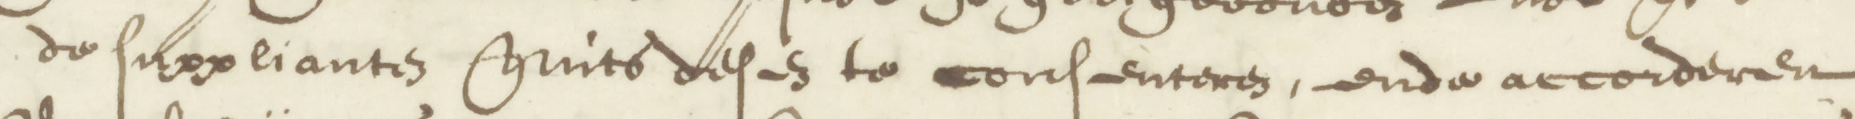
de supplianten Mits desen te consenteren, ende accorderen
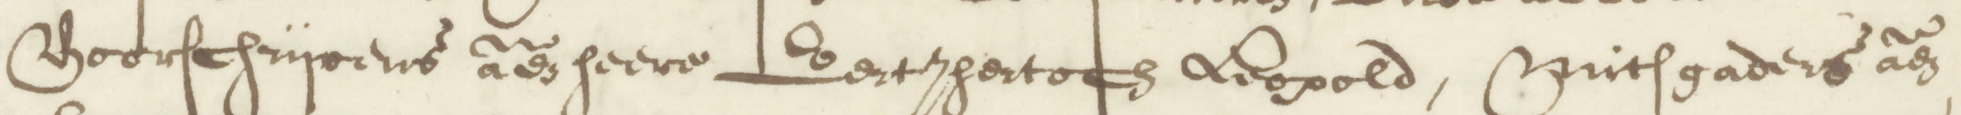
Voorschrijvens aen heere Eertzhertoch Leopold, Mitsgaders aen
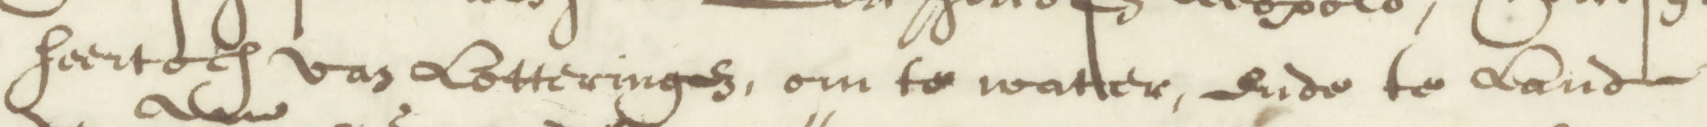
heertoch van Lotteringen, om te water, ende te Lande
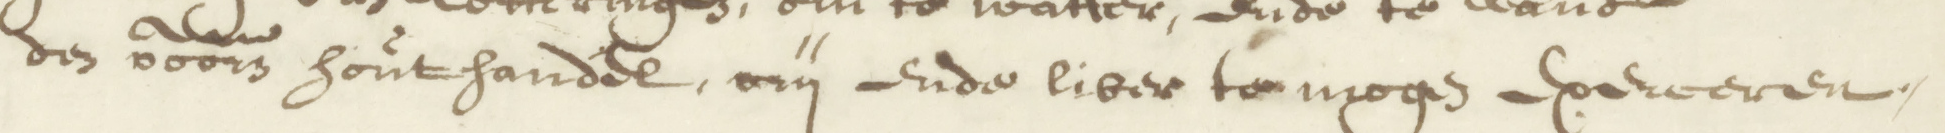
den voorn houthandel, vrij ende liber te mogen Exerceren.
